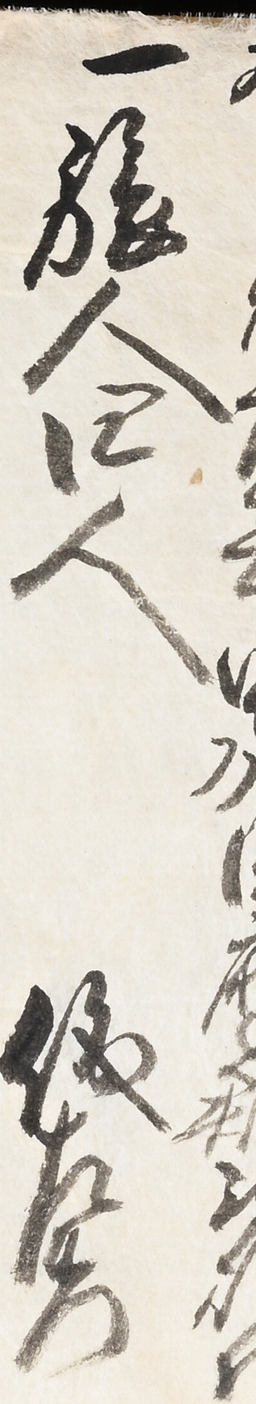一旅人四人儀左衛門
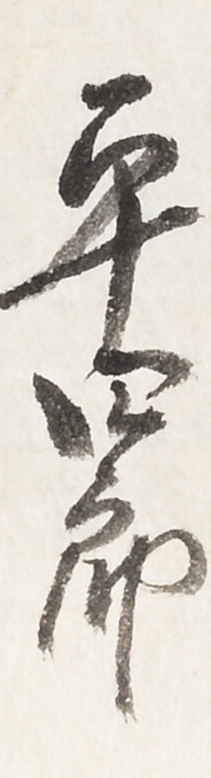平四郎
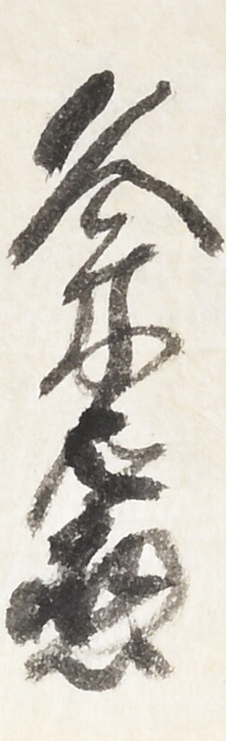久米之丞
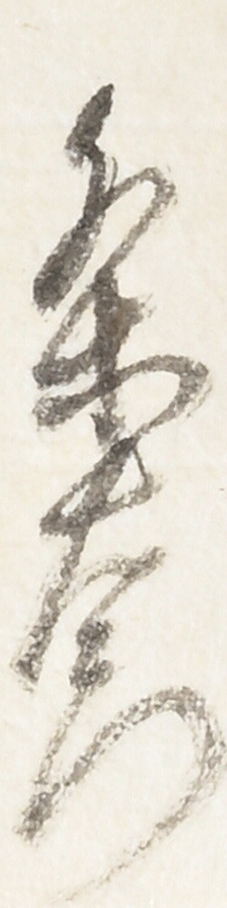条右衛門
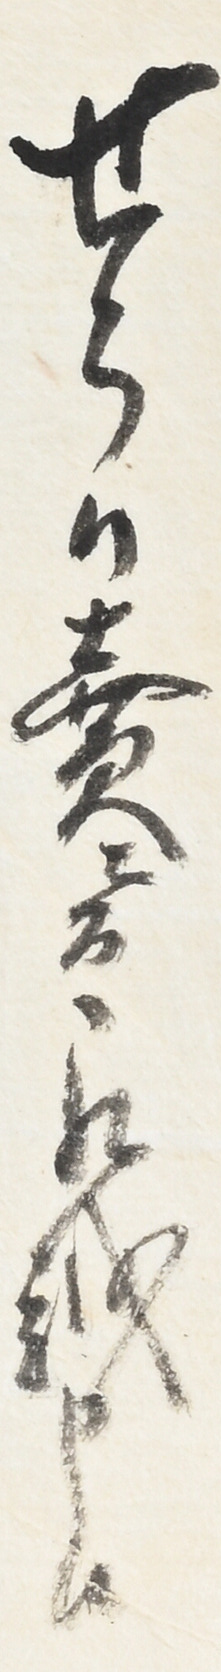せうり売ニ而罷越申候
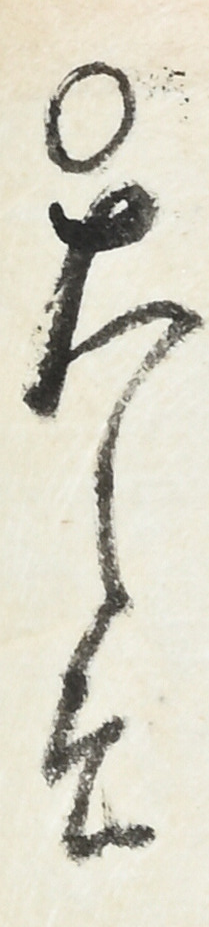〇右之者

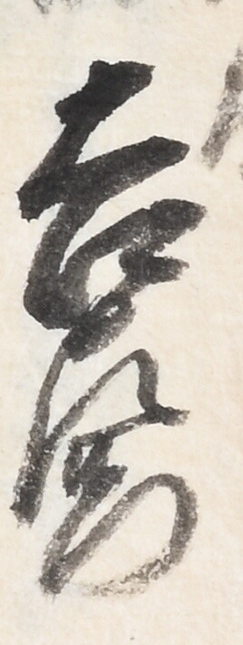籐左衛門
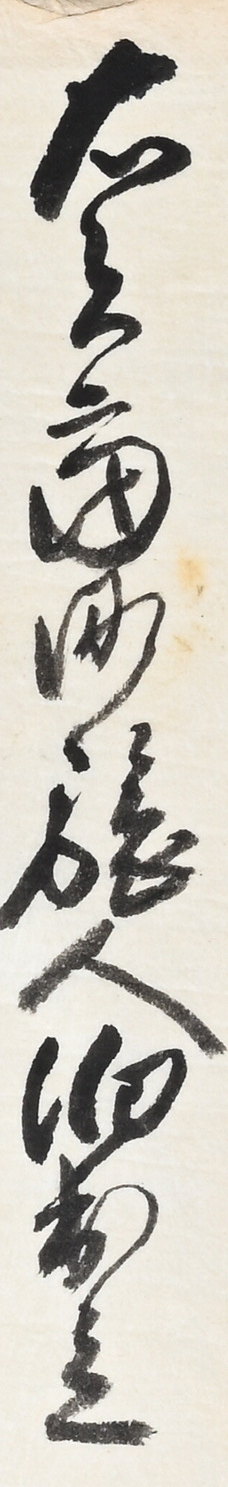右者当町旅人泊出立
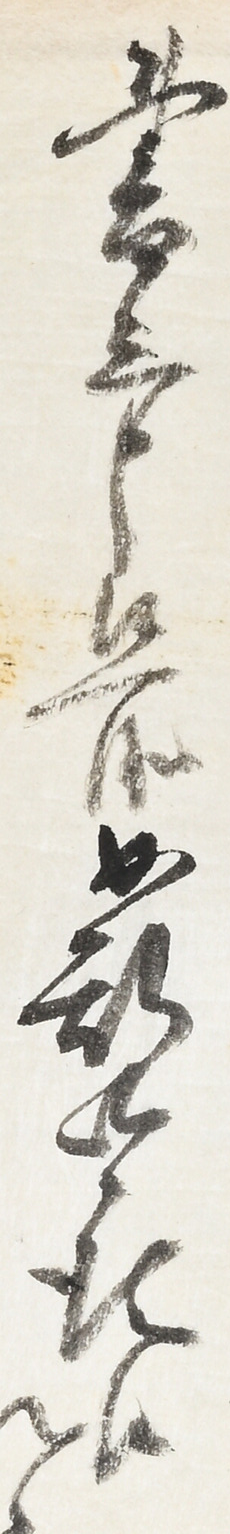書上申候所如斯御座候
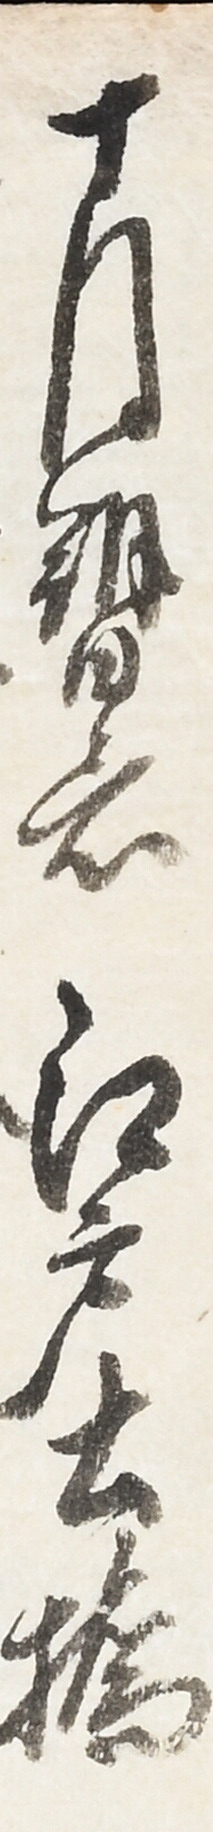十月朔日着江戸土橋
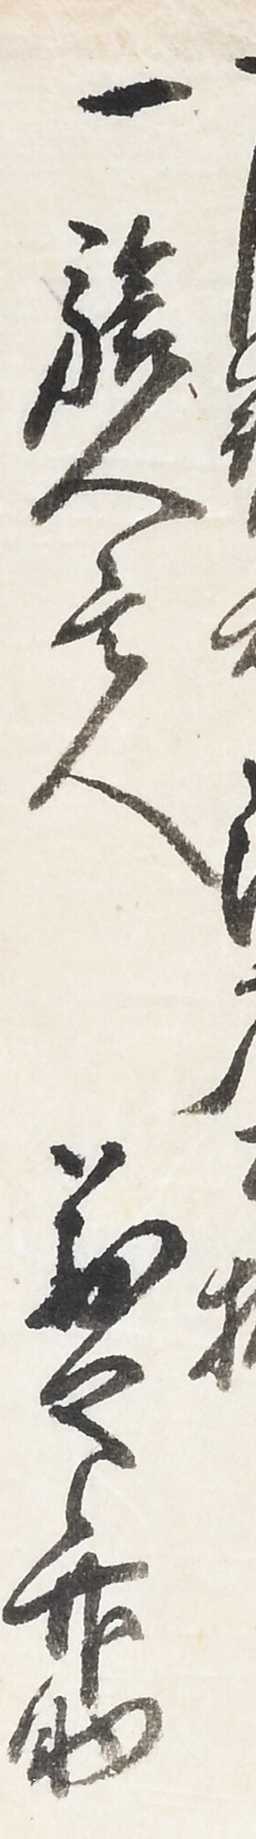一旅人壱人万や竹助
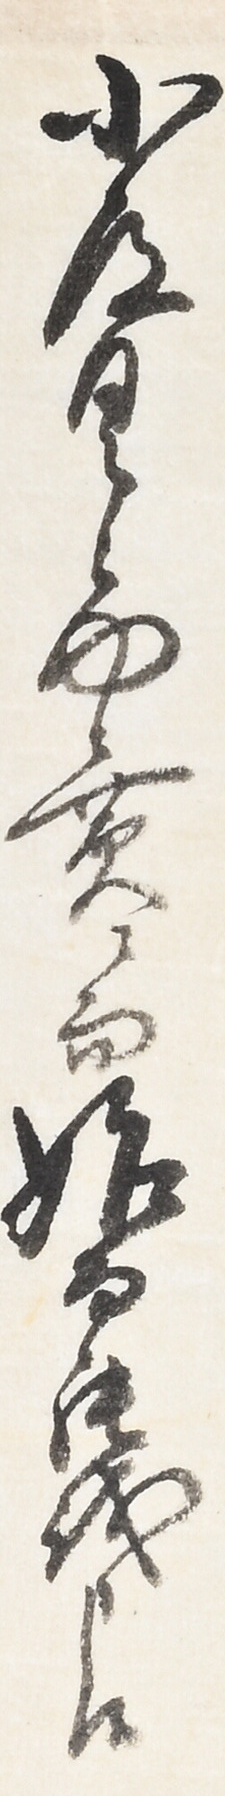小道具商売ニ而始而罷越申候
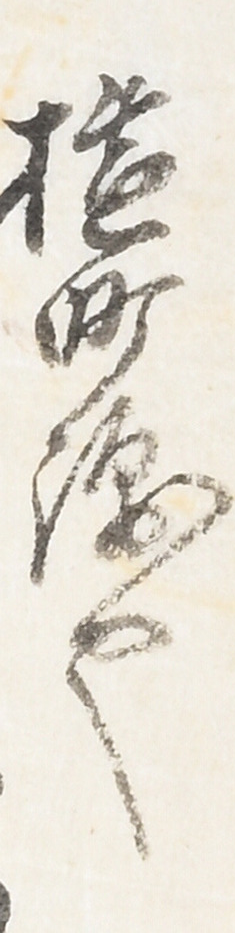横町綿や
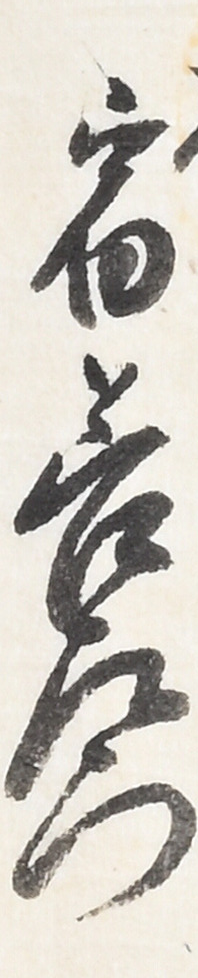宿善左衛門
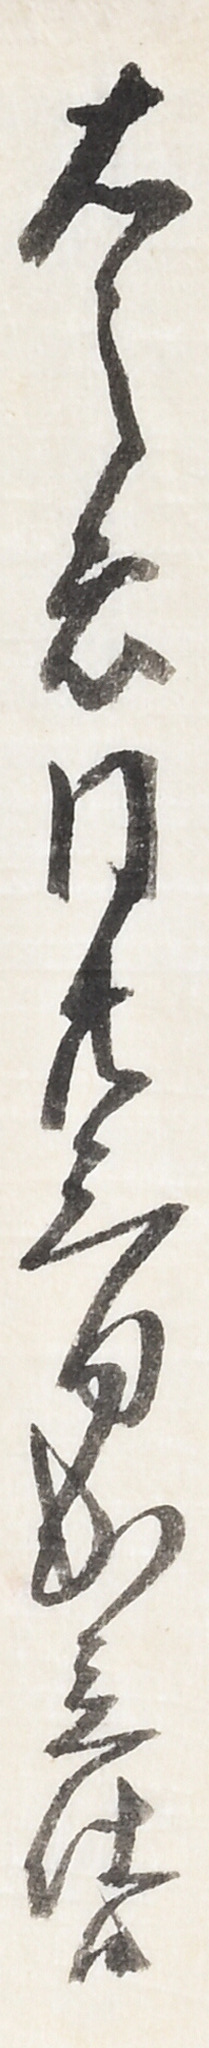右之者同廿三日出立仕候
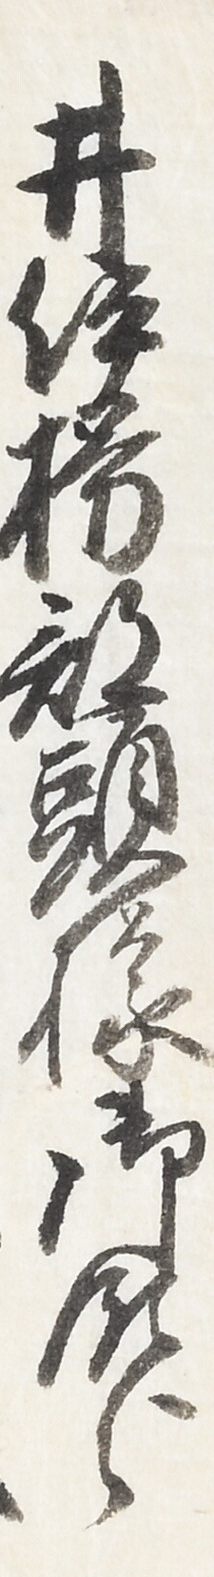井伊掃部頭様御領分
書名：旅人泊控帳
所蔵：伊那市立高遠町図書館・合同会社AMANE
